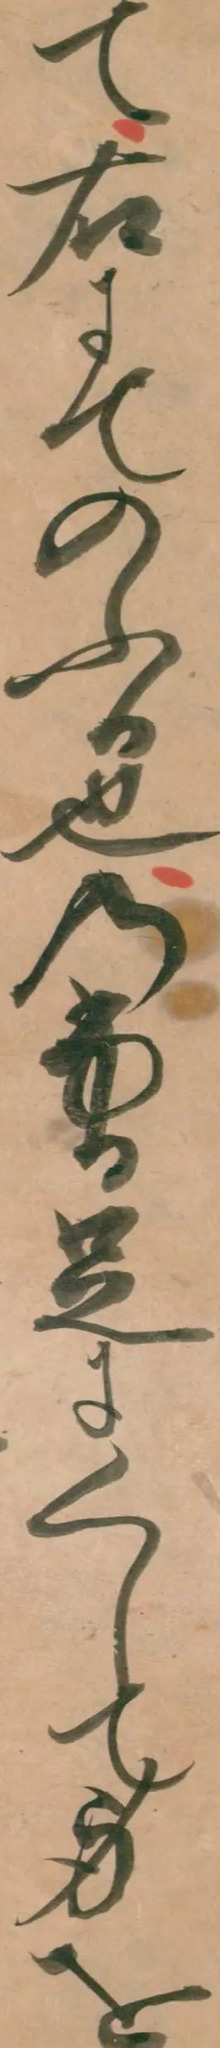て右にてのふる也のふる足にくして身を
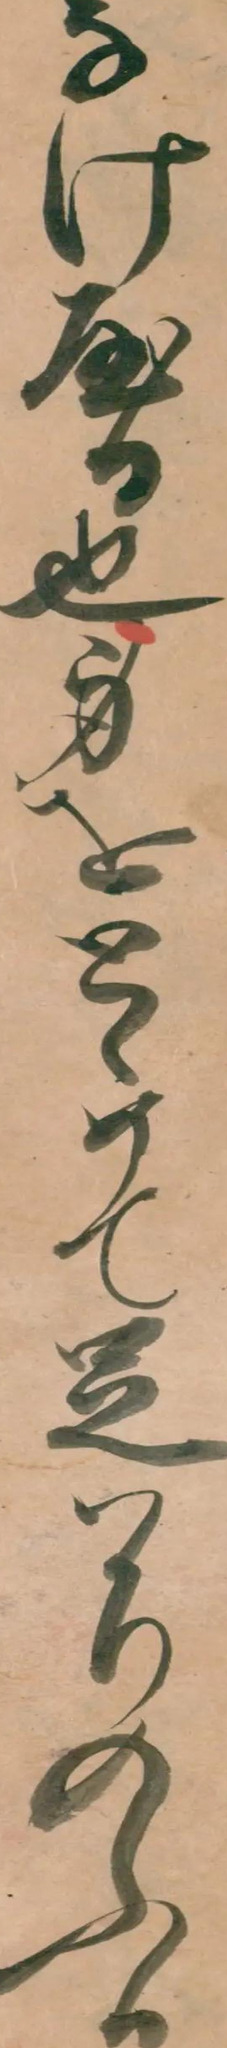なけやる也身をとゝめて足ハかりのふる
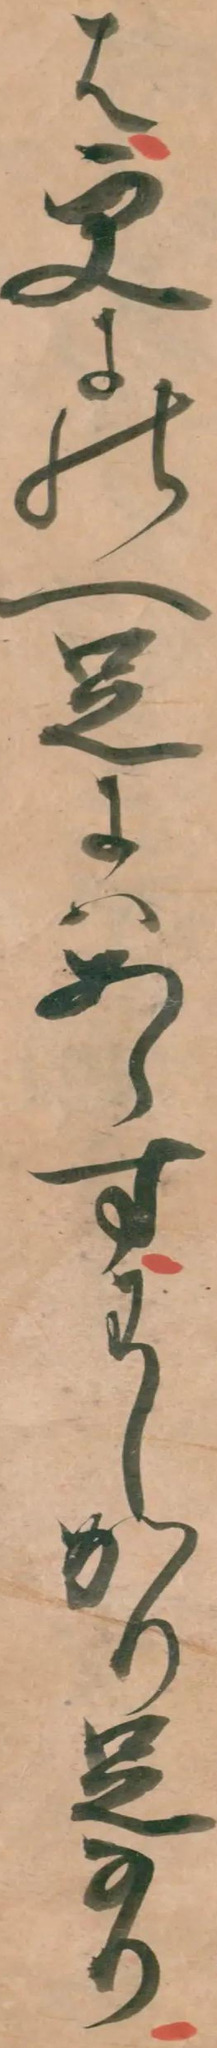は更にのへ足にハあらすわしかり足なり
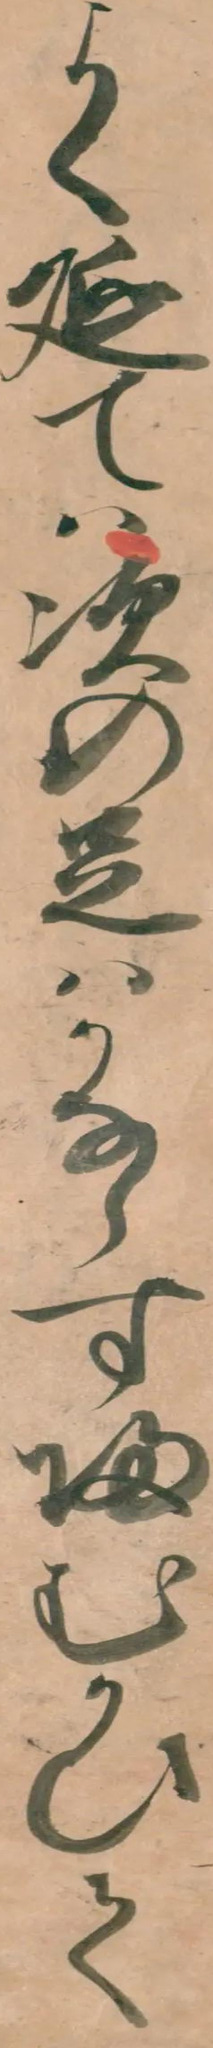よく延てハ次の足ハかならす帰むかひて
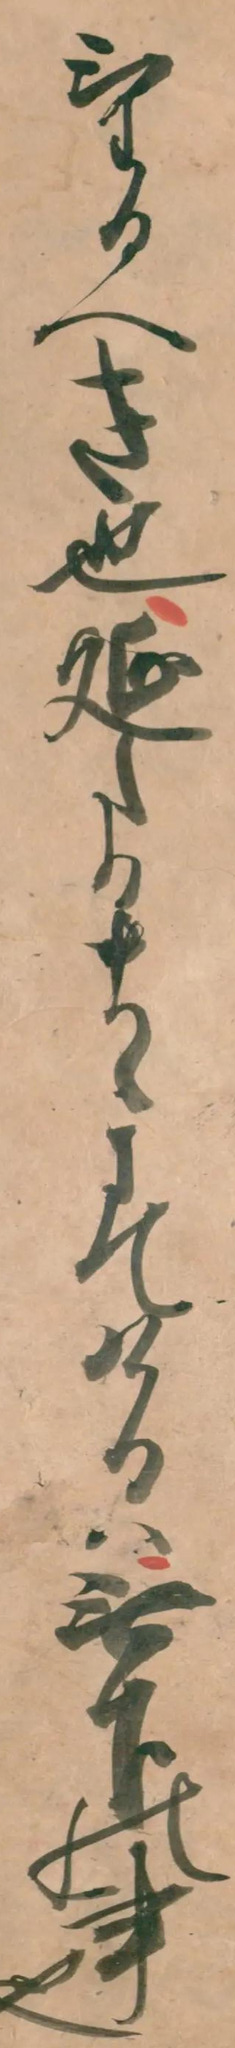けるへき也延たるまゝにてけるハ無下の事也
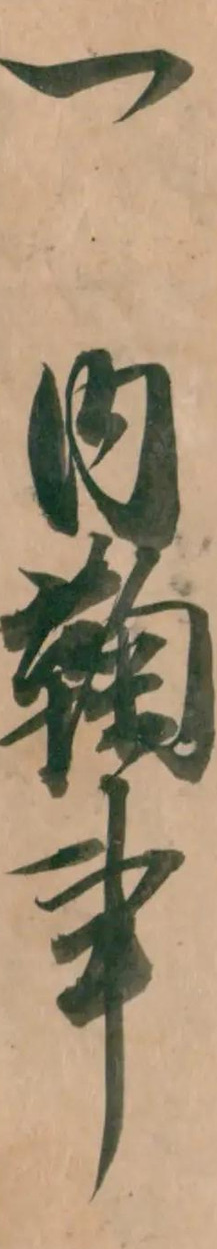一内鞠事
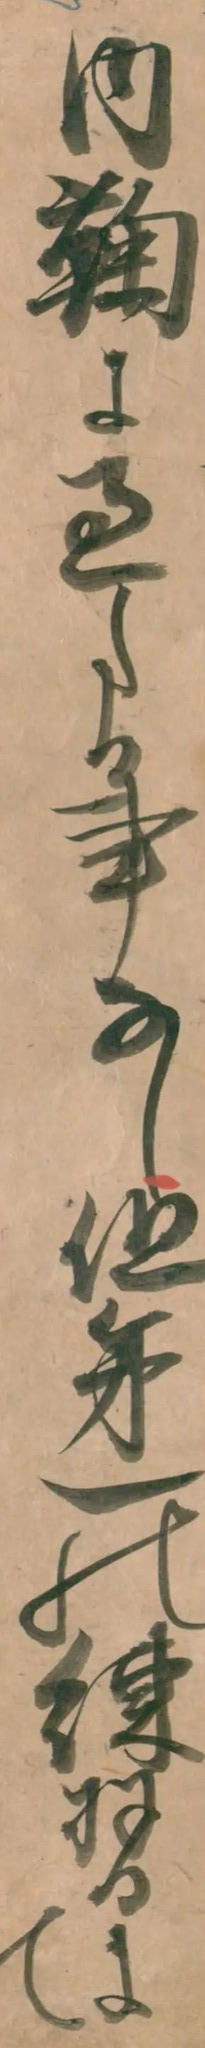内鞠に過たる事なし但第一の練習には

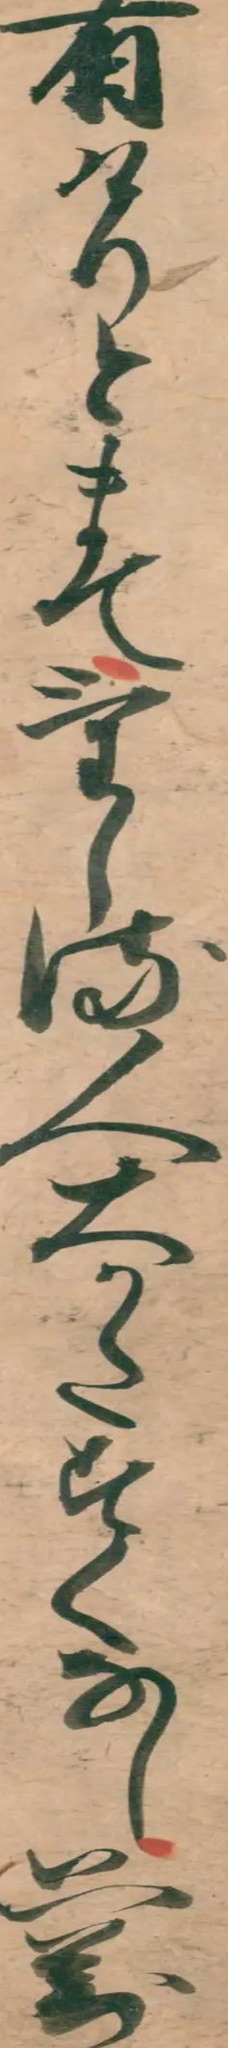有けりとまて気しる人大かたすくなし只万
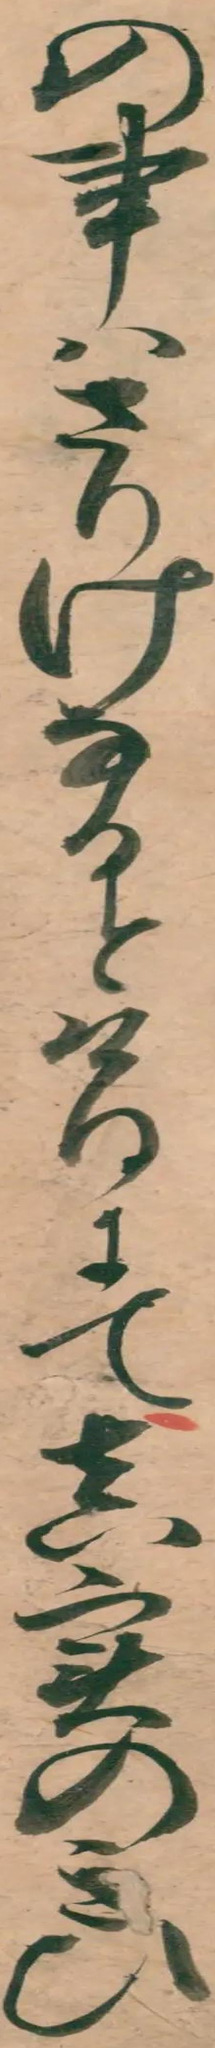の事ハさりけなること今日にて真実のきひ
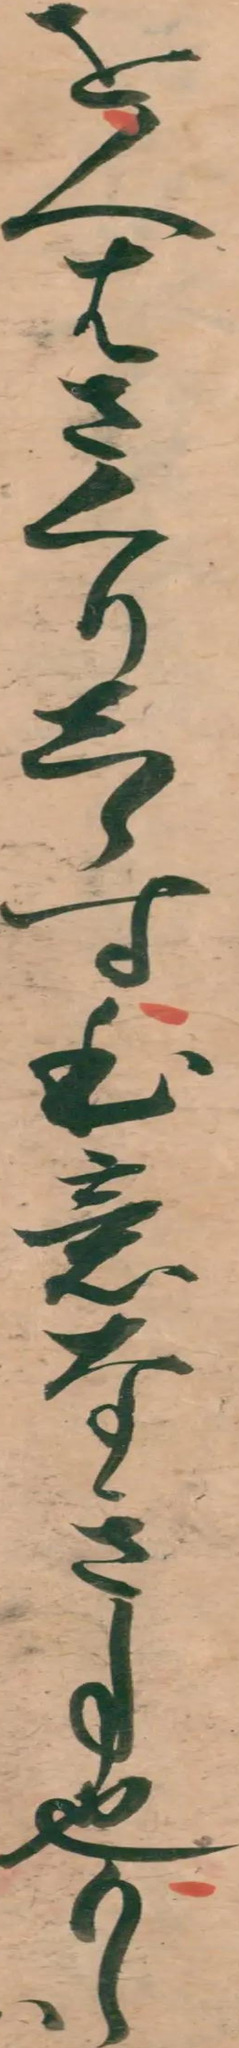を人はさくりしらす本意なき事也もしハ
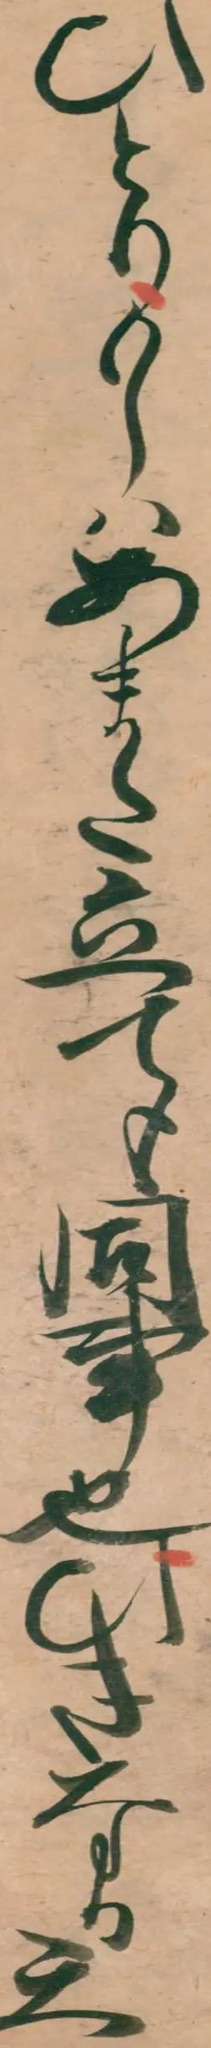ひとりもしハあまた立ても同事也ひきなる天
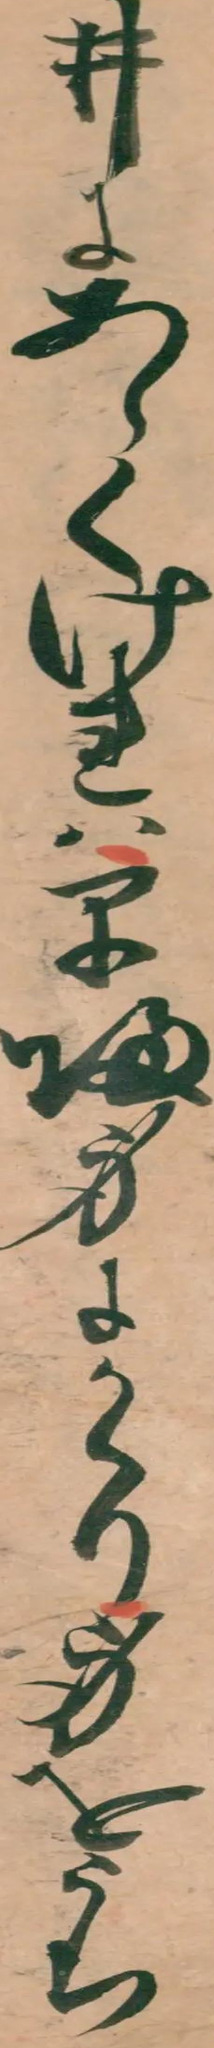井にあらくけれハ早帰身にかゝり身をうち
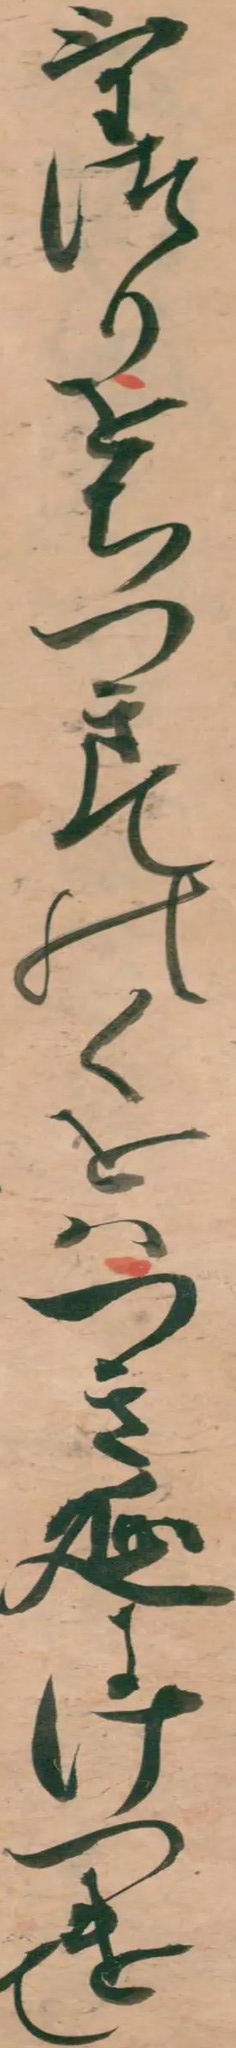けつりをちつきてのくをハつき延にけつけて
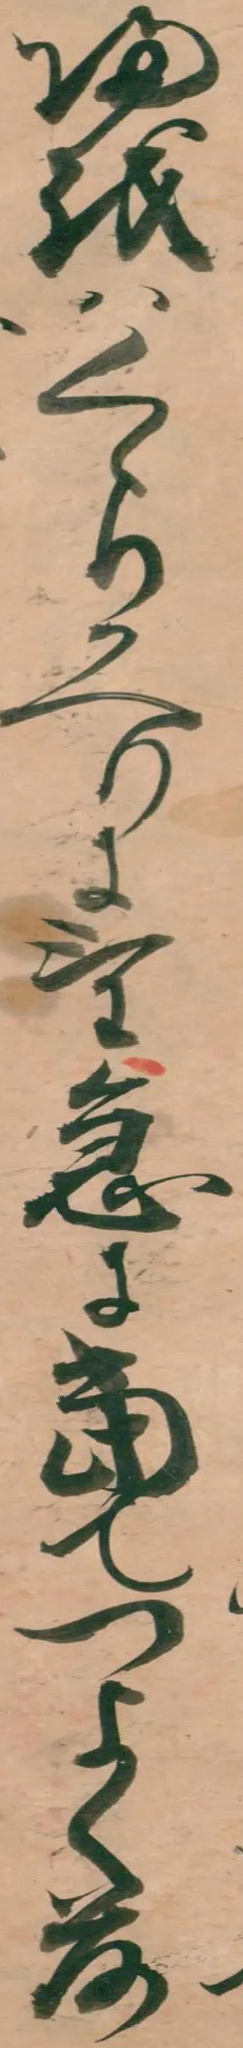帰をハくゝりかへりに気急に当てつよく落
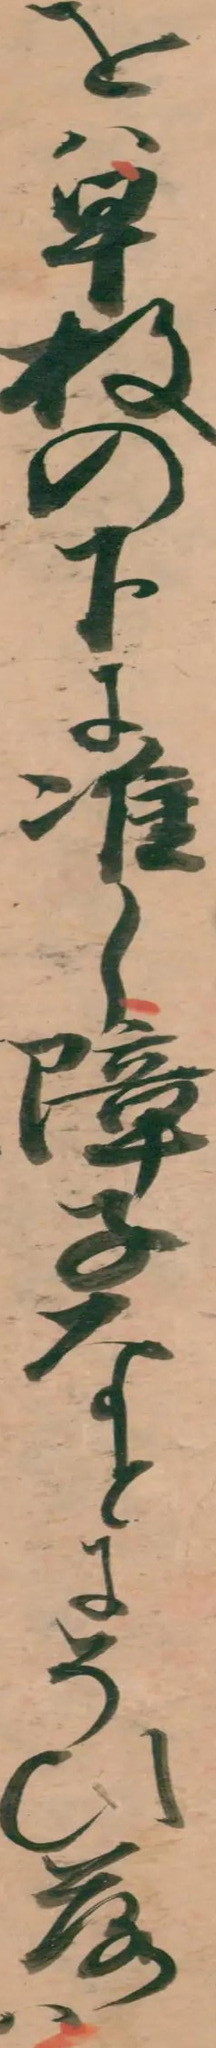をハ早枝の下に准し障子なとにそひ落ハ
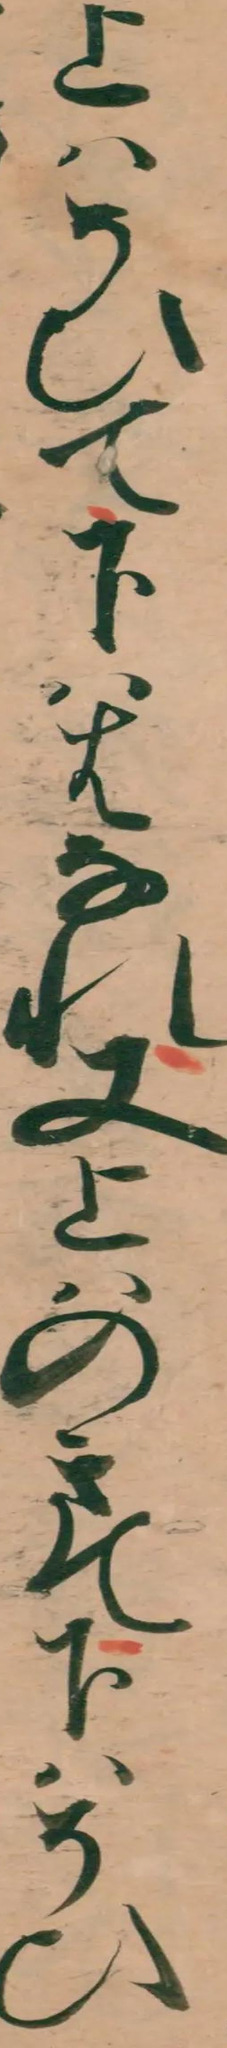上ハそひて下ハはなれ又上ハのきて下ハそひ
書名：蹴鞠之条々大概
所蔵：国立国会図書館 National Diet Library, JAPAN
